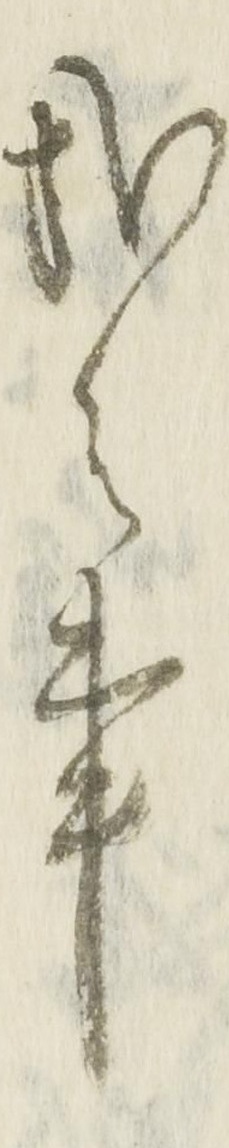哉之事
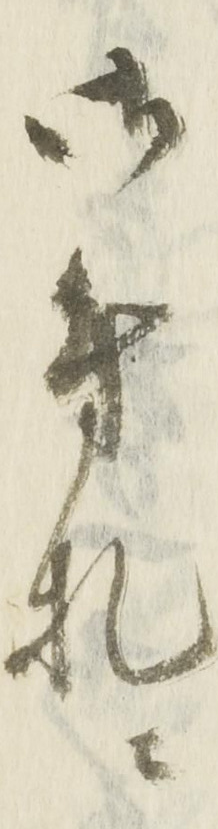御付札ニ
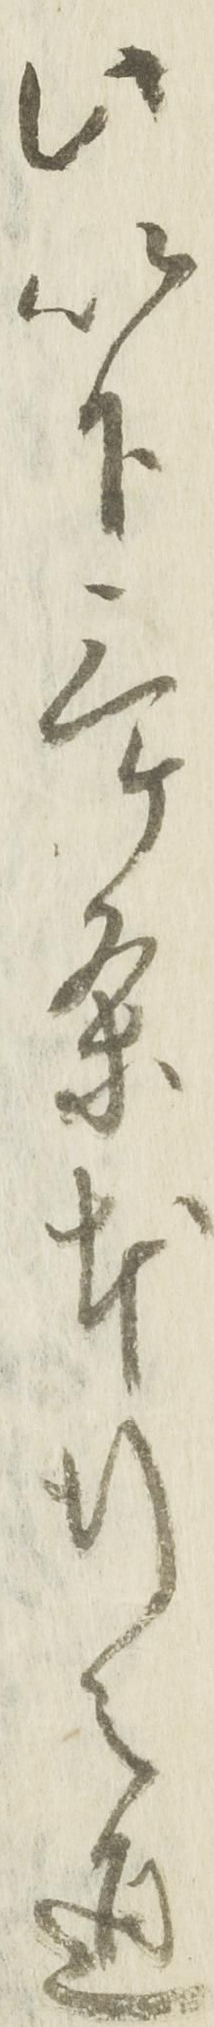此以下三ケ条本行之通
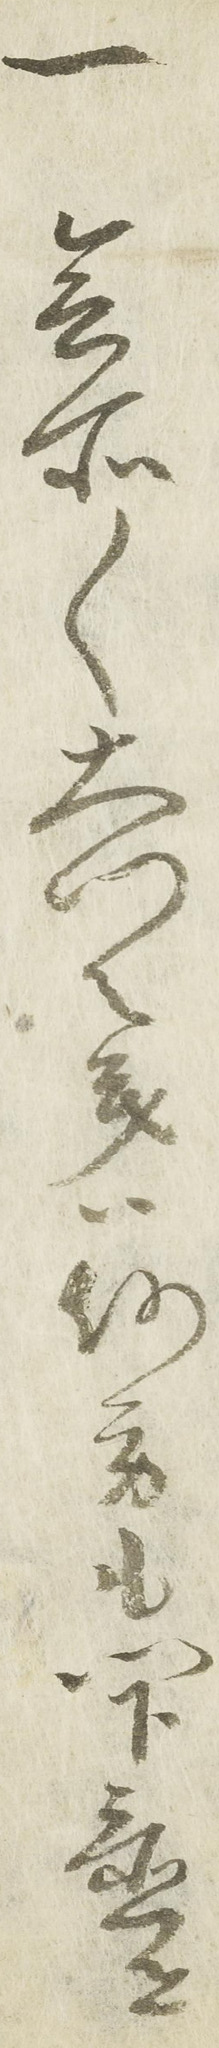一念所〳〵大門の義は何方も閉置と
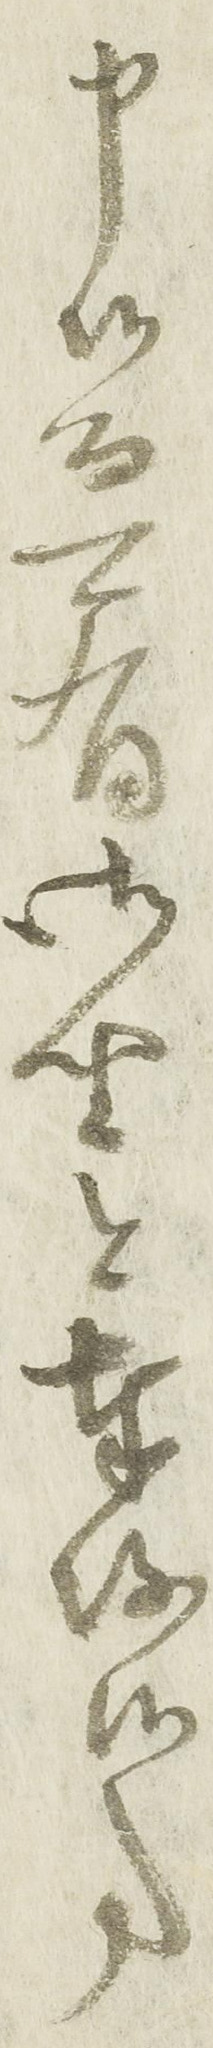申候而可有御坐と奉存候事
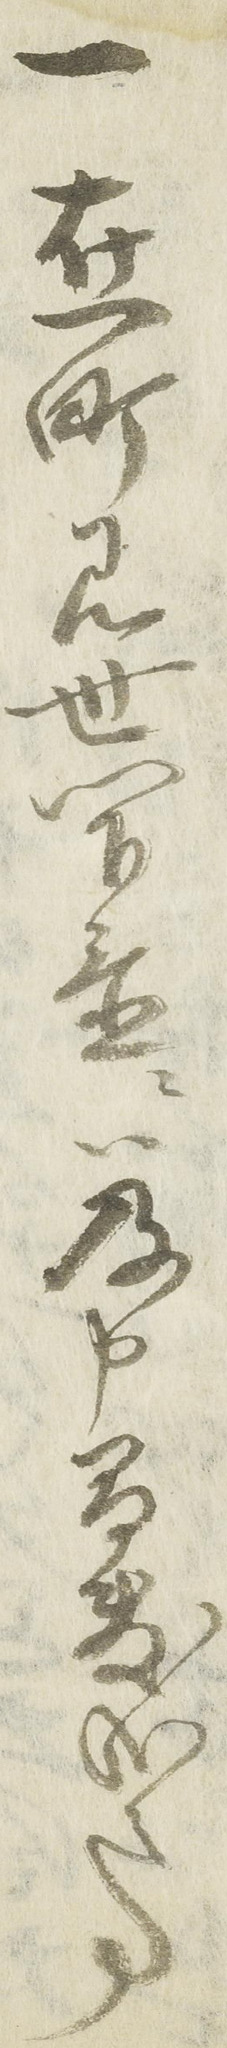一在町見世閉置ニは及申間敷哉事
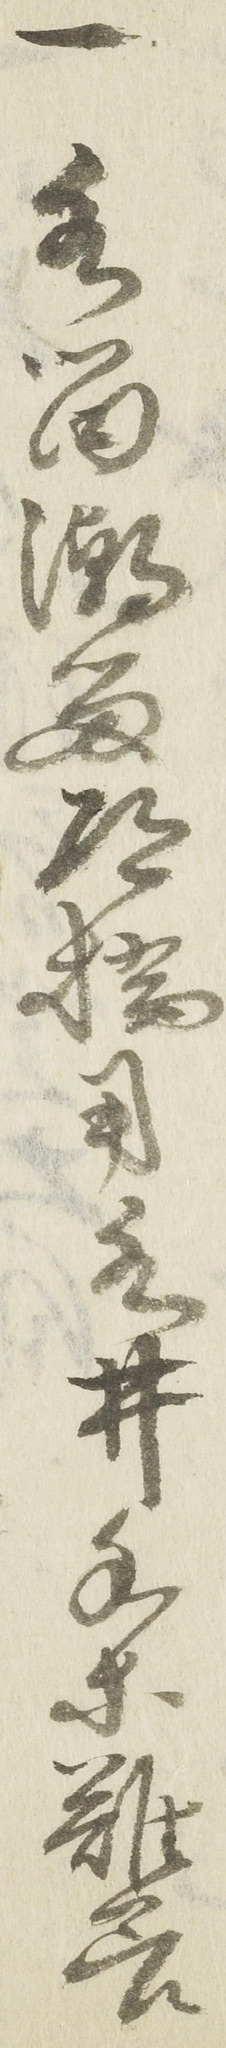一水留潮留道橋用水井水等難差
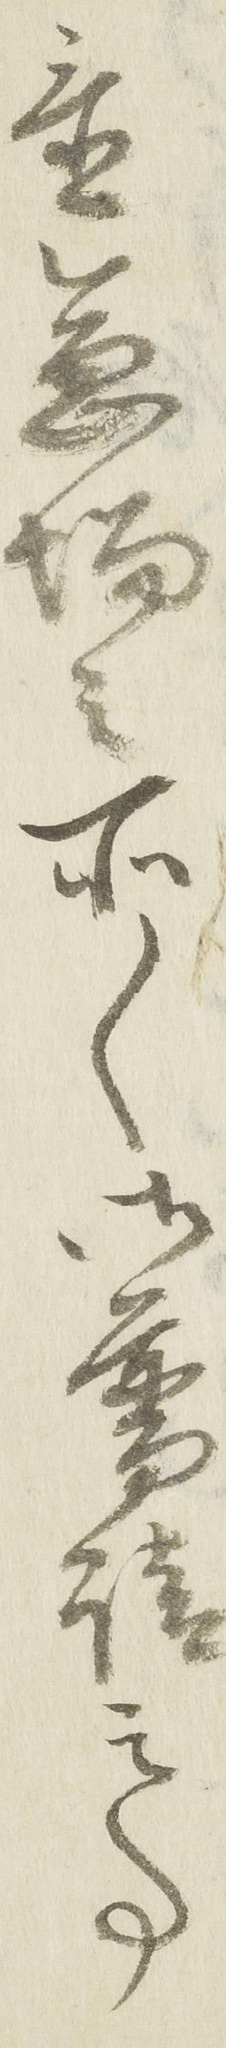置急場之所〳〵御普請之事
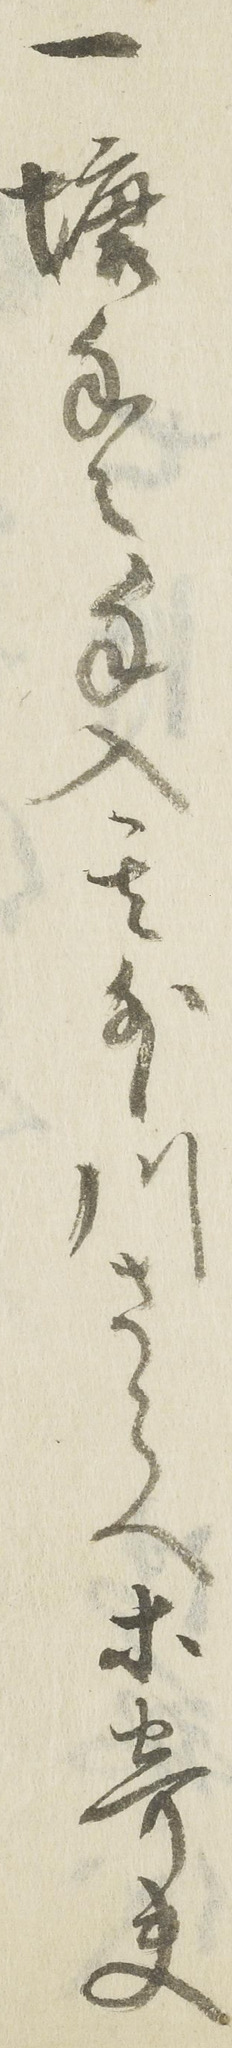一塘手之手入其外川さらへ等寄夫
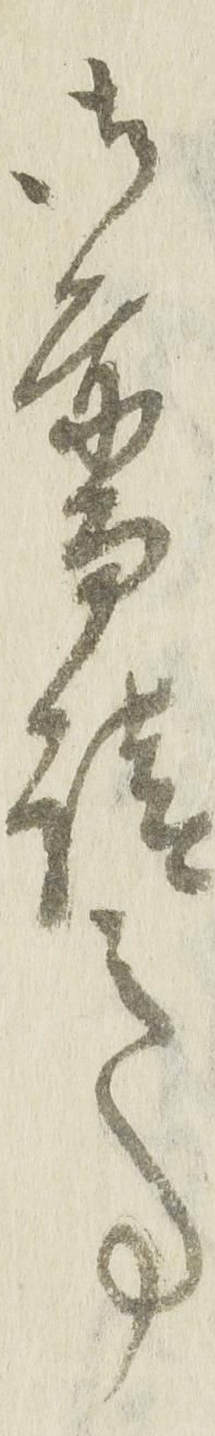御普請之事

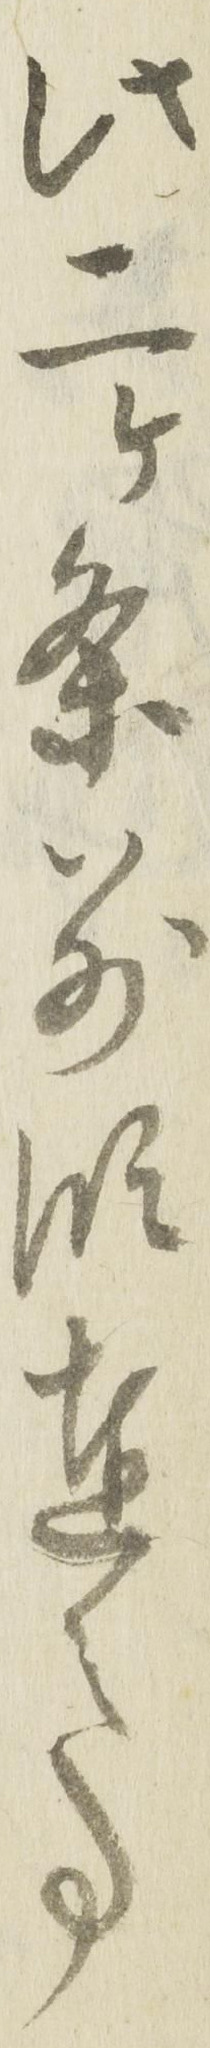此二ケ条別段達之事
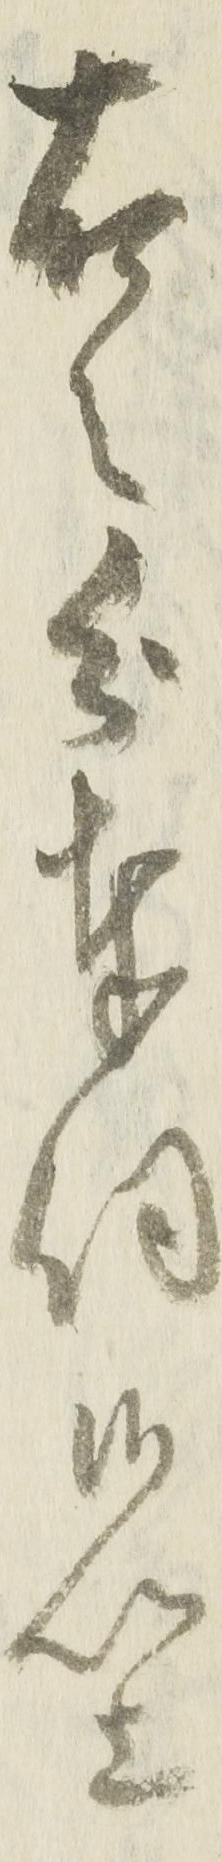右之分奉伺候以上
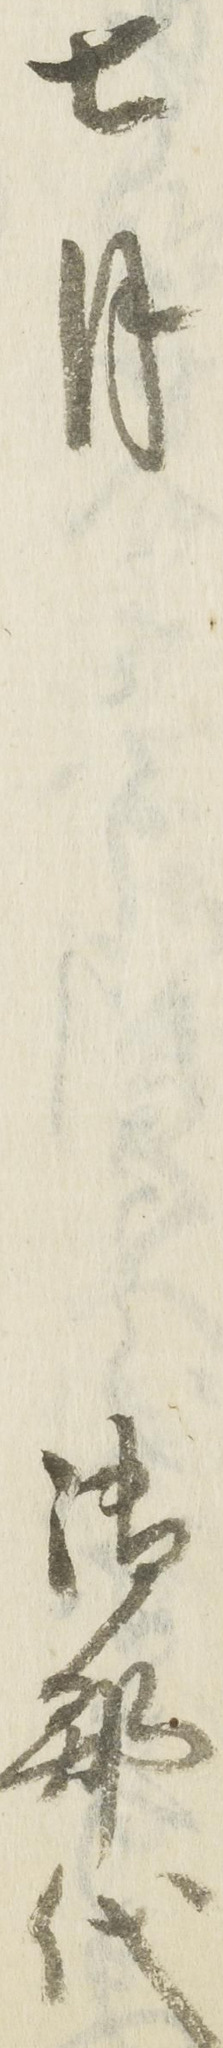七月御郡代
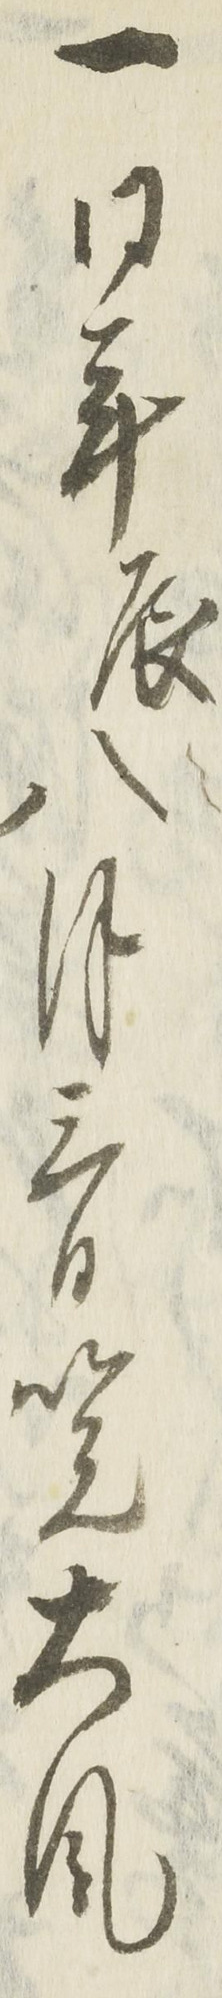一同年辰八月三日晩大風
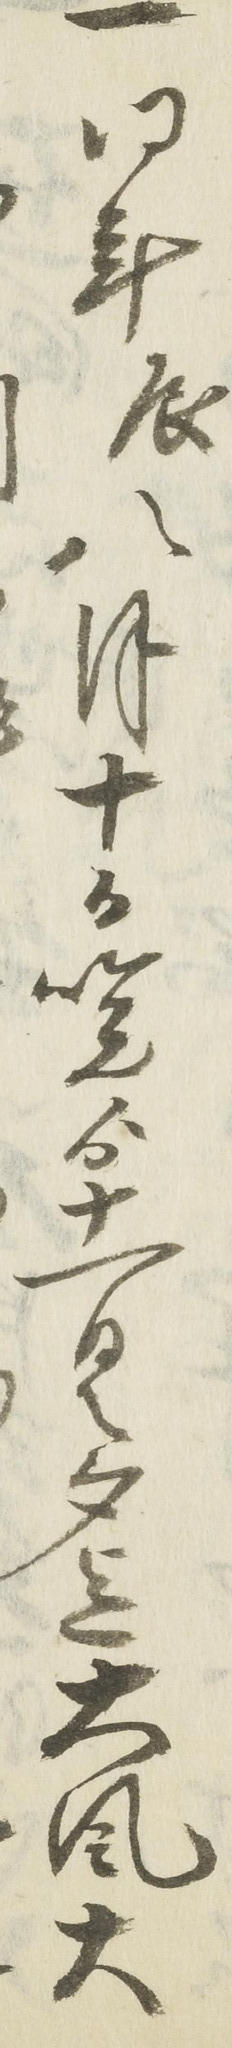一同年辰八月十日晩ゟ十一日之夕迄大風大
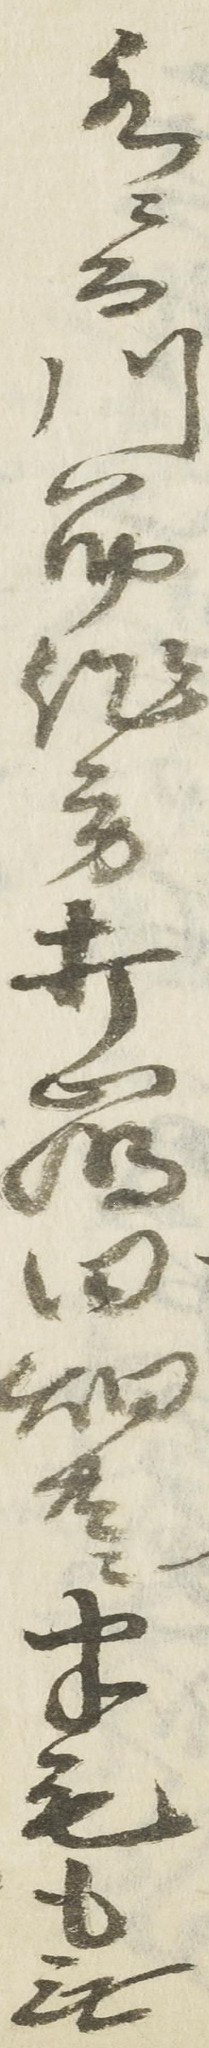水ニ而川筋作方打崩田畑共ニ半毛も無
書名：後見笑
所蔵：東京大学地震研究所図書室 Earthquake Research Institute Library, The University of Tokyo, JAPAN
